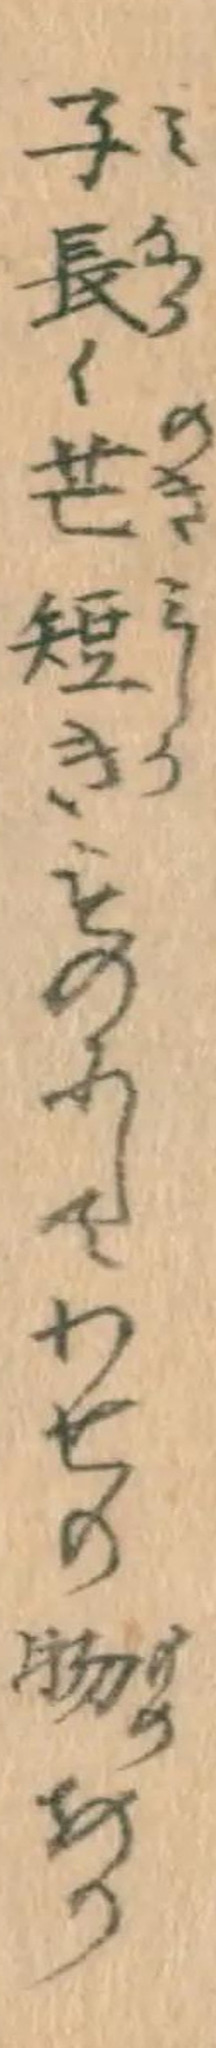子長く芒短きものにしてわせの物あり
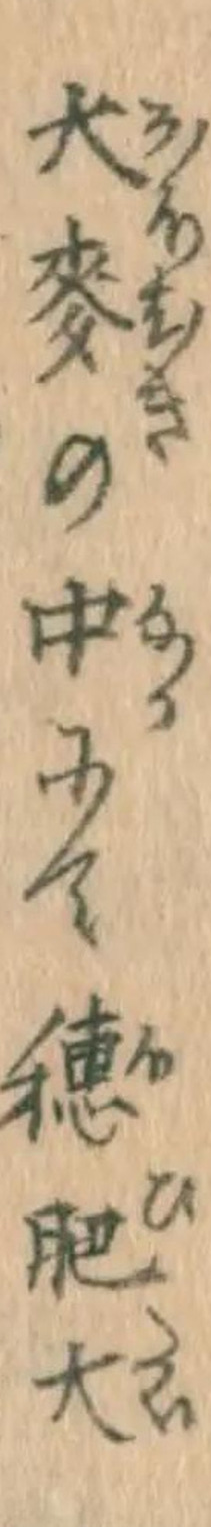大麦の中にて穂肥大
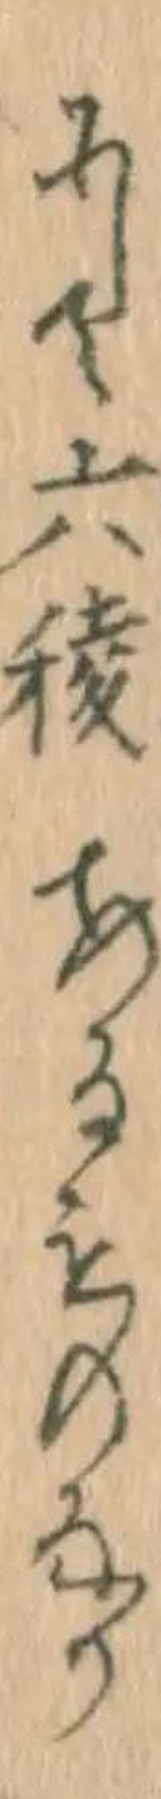にして六稜あるものなり

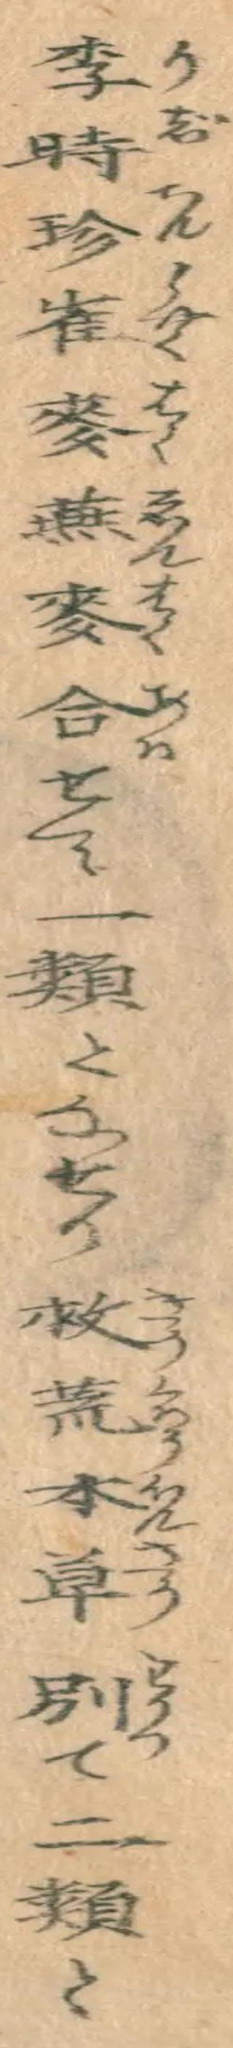李時珍雀麦燕麦合せて一類となせり救荒本草別て二類と
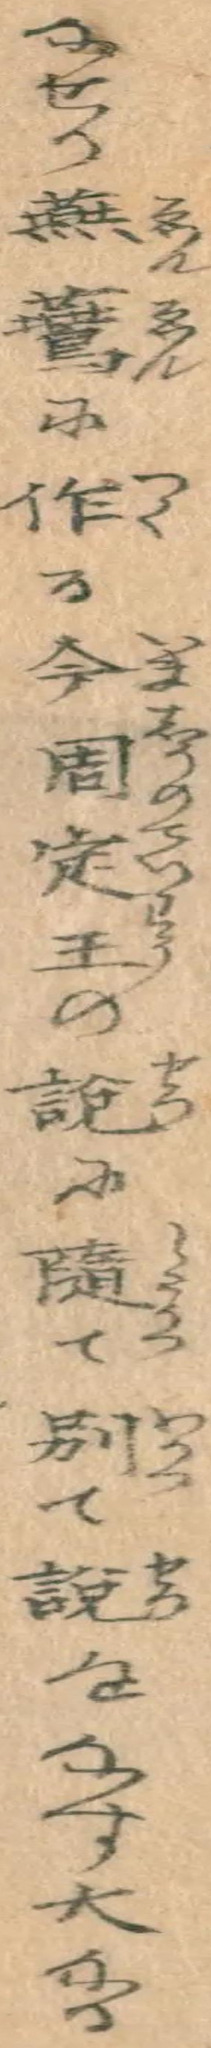なせり燕燕に作る今周定王の説に随て別て説をなす大なる
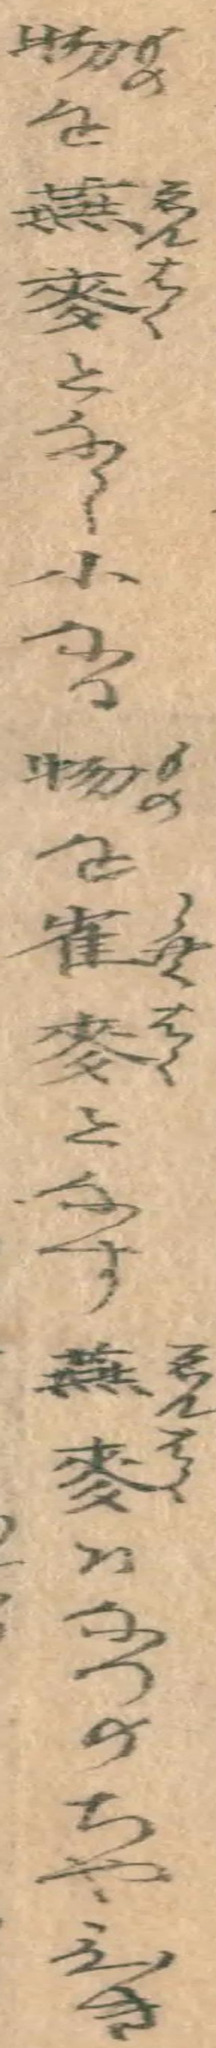物を燕麦となし小なる物を雀麦となす燕麦はなつのちやむき
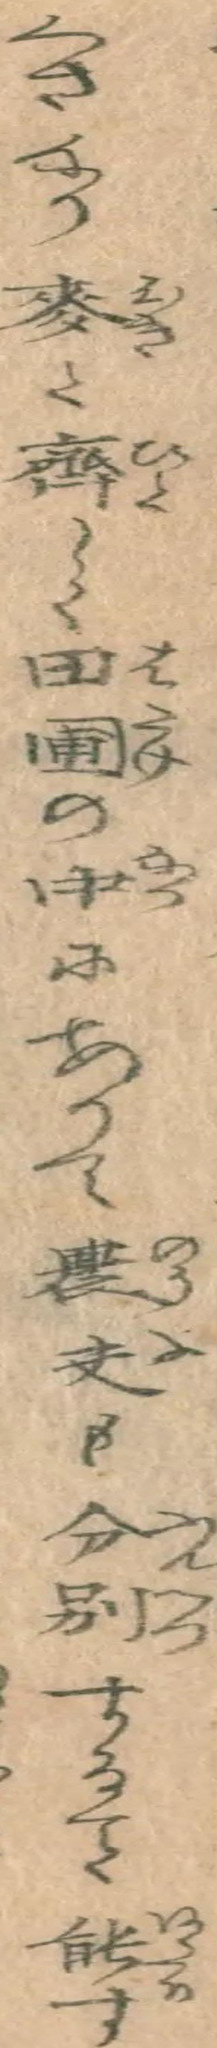くさなり麦と斉しく田圃の中にありて農夫も分別すること能す
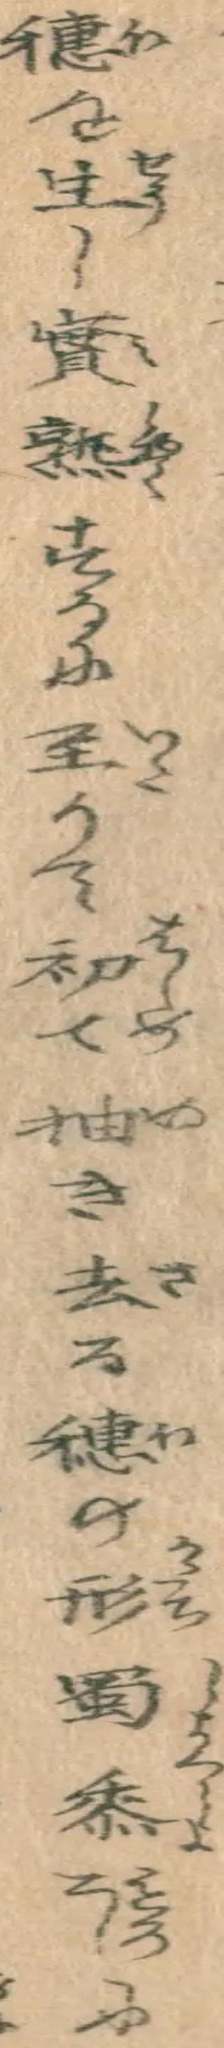穂を生し実熟するに至りて初て抽き去る穂の形蜀黍もろこしに
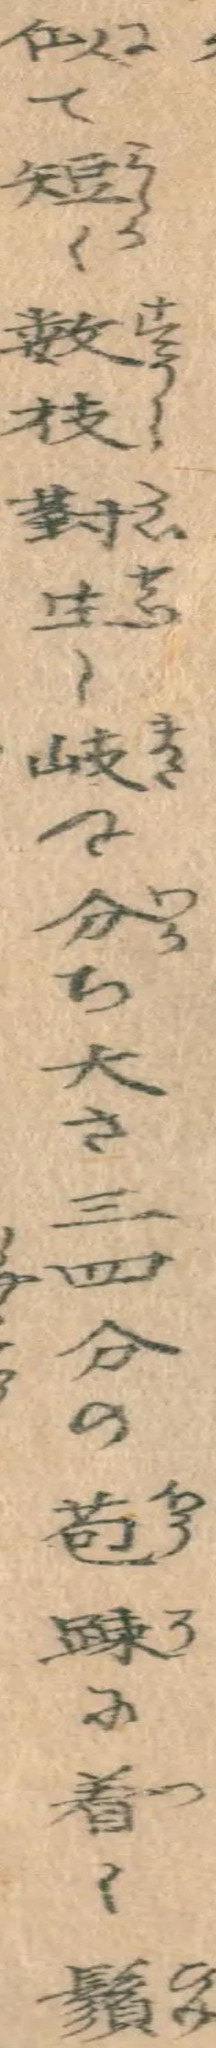似て短く数枝対生し岐を分ち大さ三四分の苞疏に着く鬚
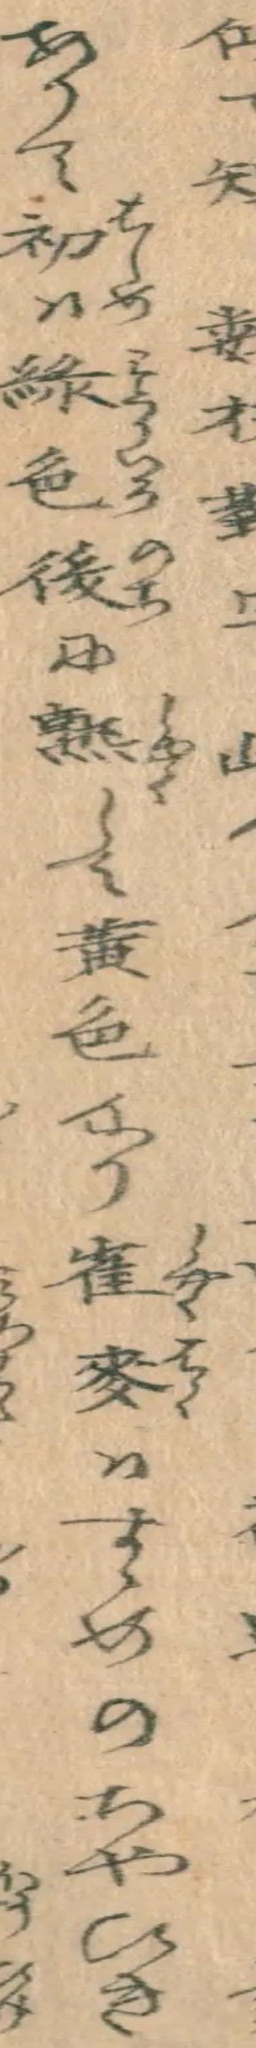ありて初は緑色後に熟して黄色なり雀麦はすゝめのちやひき
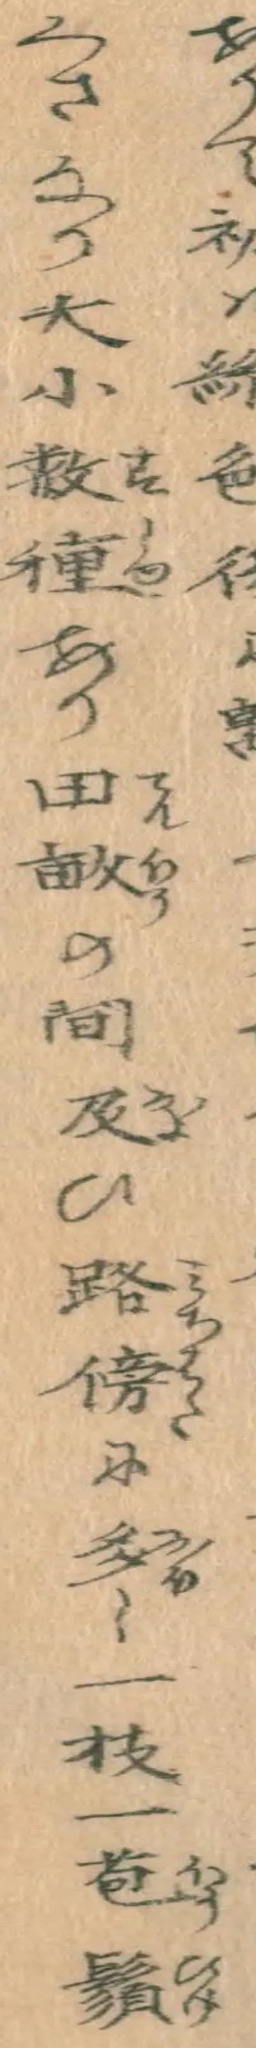くさなり大小数種あり田畝の間及ひ路傍に多し一枝一苞鬚
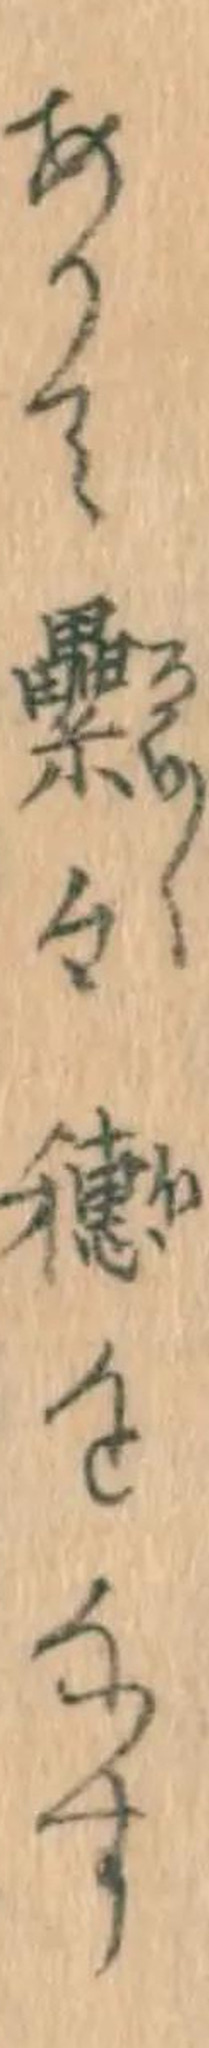ありて纍々穂をなす

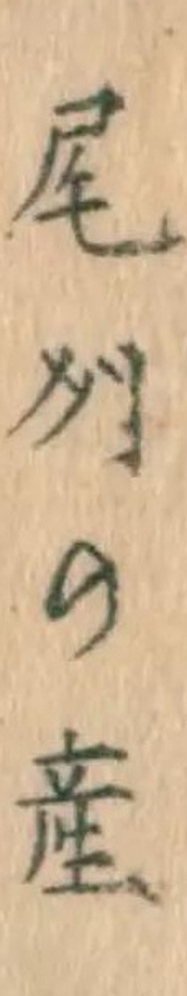尾州の産

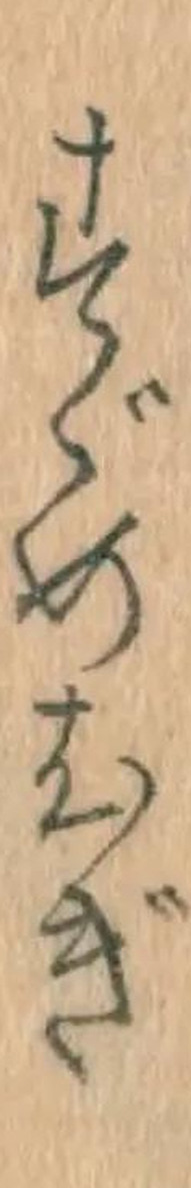すゞめむぎ
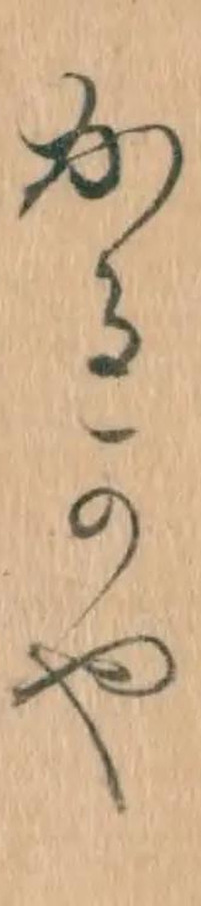かるかや

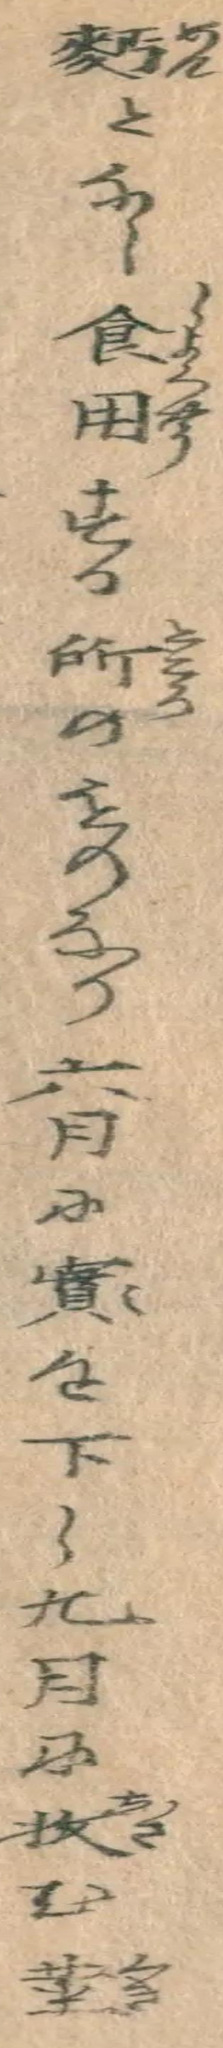麺となし食用する所のものなり六月に実を下し九月に収む茎
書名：本草図譜. 巻40-42
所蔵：国立国会図書館 National Diet Library, JAPAN
